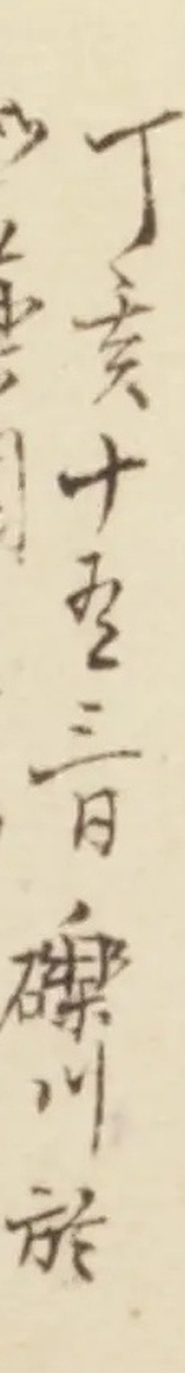丁亥姑洗十有五日川於
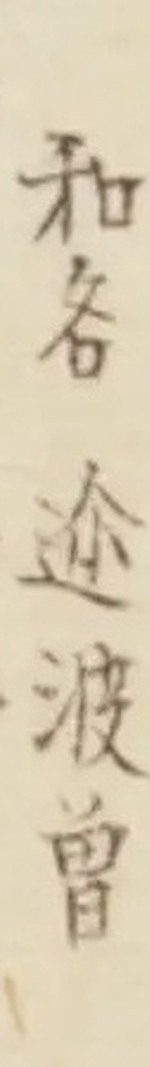和名迩波曽
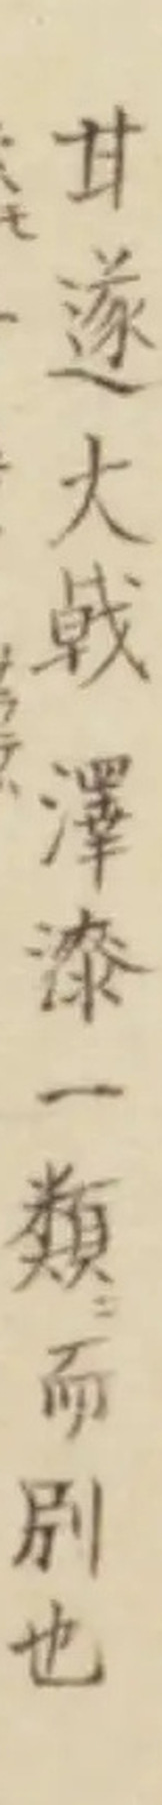甘遂大戟澤漆一類而別也
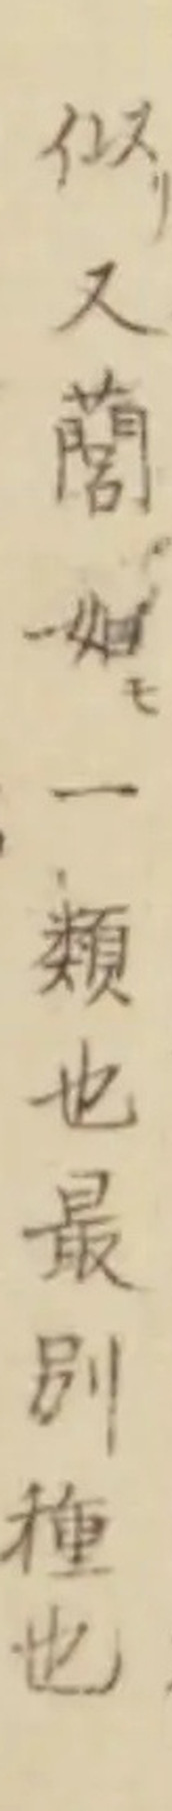似り又如一類也最別種也

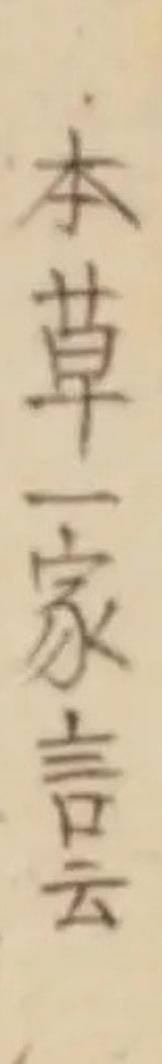本草一家言云
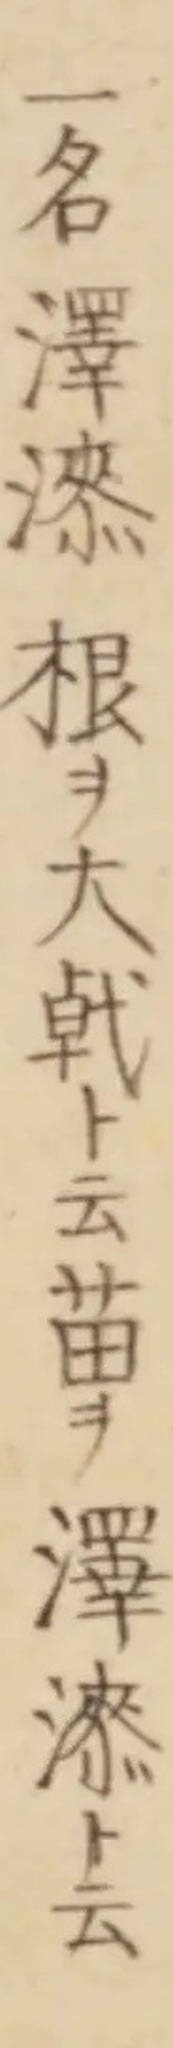大戟一名澤漆根を大戟と云苗を澤漆と云
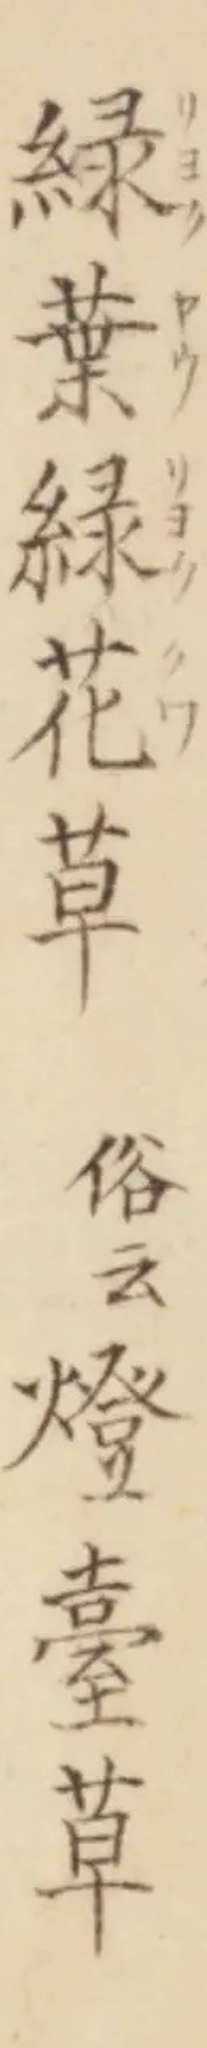緑葉緑花草俗云燈臺草
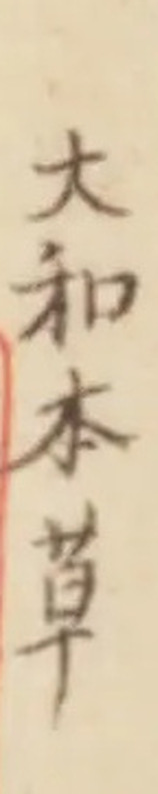大和本草
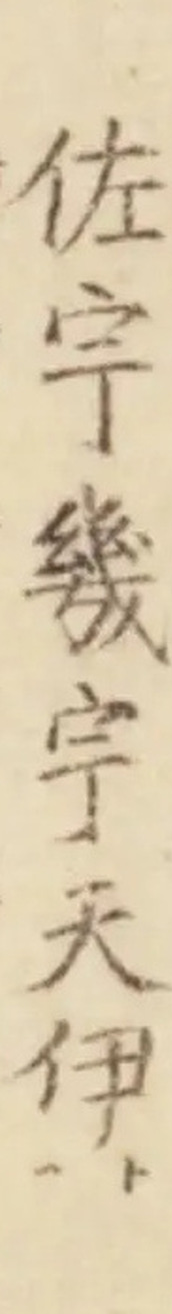佐宇幾宇天神と
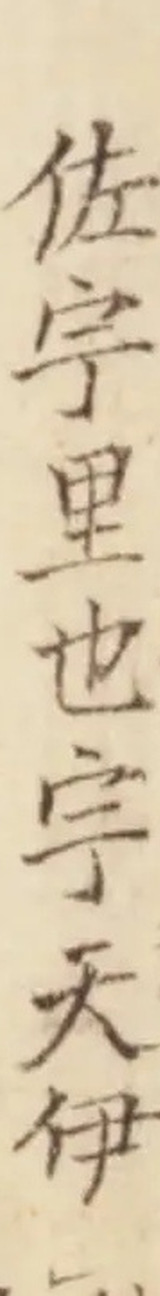佐宇里也宇天伊
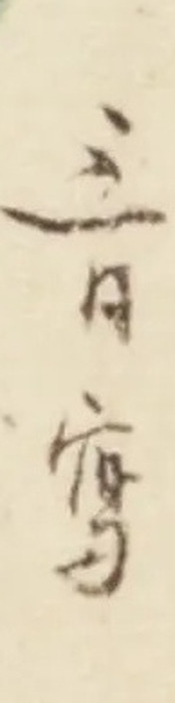三日寫
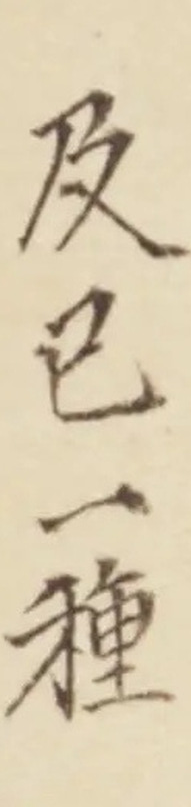及巳一種

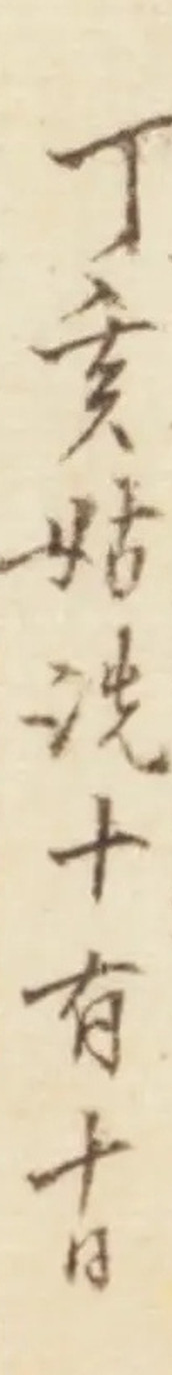丁亥姑洗十有十日
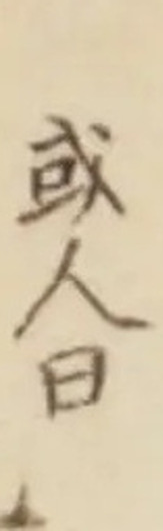或人曰

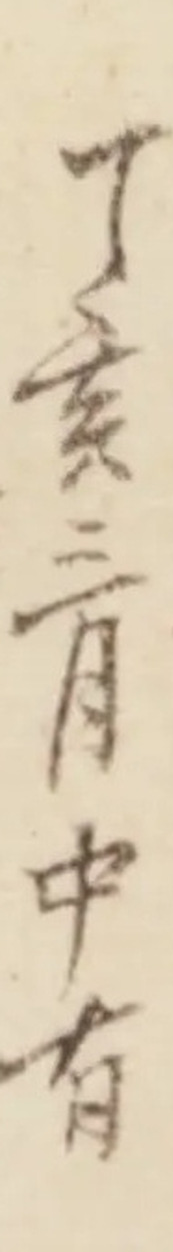丁亥三月中有

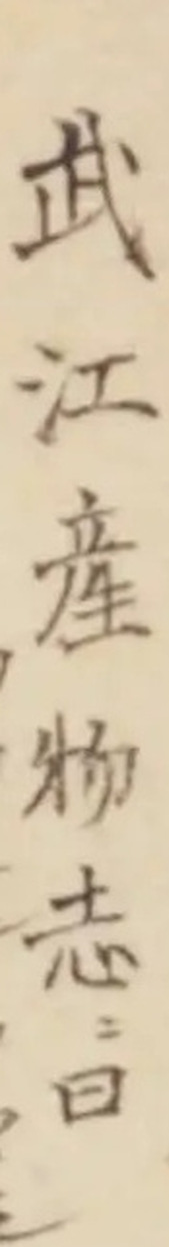武江産物志に曰
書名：梅園草木花譜春之部. 3
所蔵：国立国会図書館 National Diet Library, JAPAN
